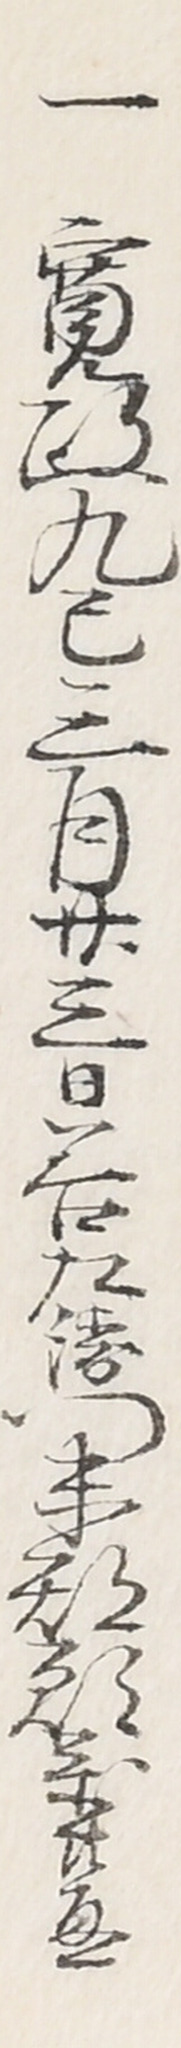一寛政九巳三月廿三日善左衛門末期願置候通
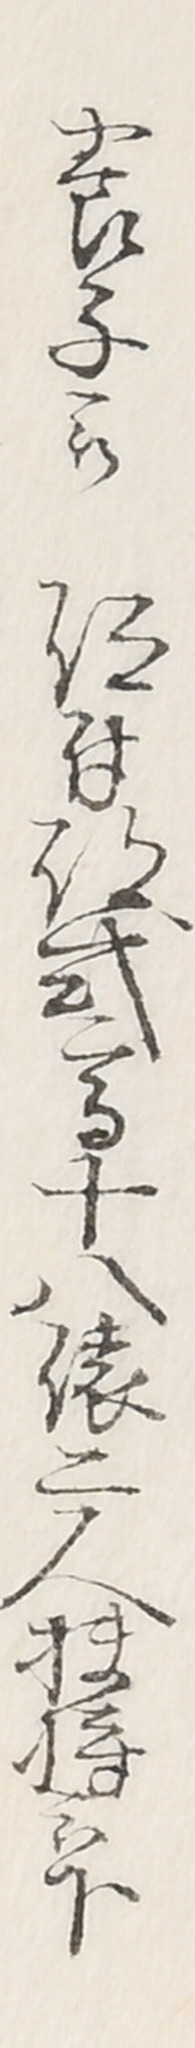養子被仰付跡式高十八俵二人扶持被下
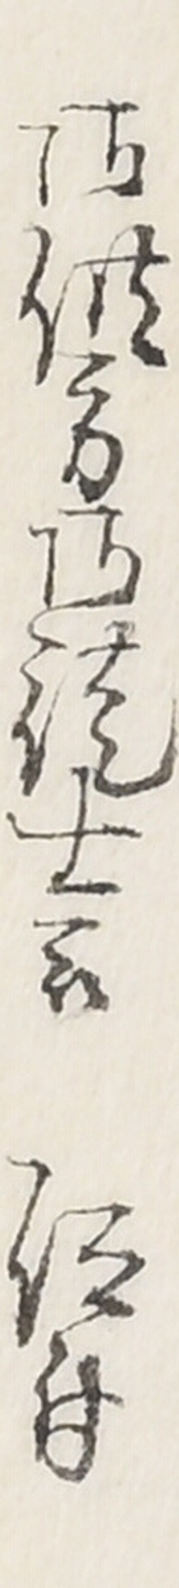御供方徒士被仰付
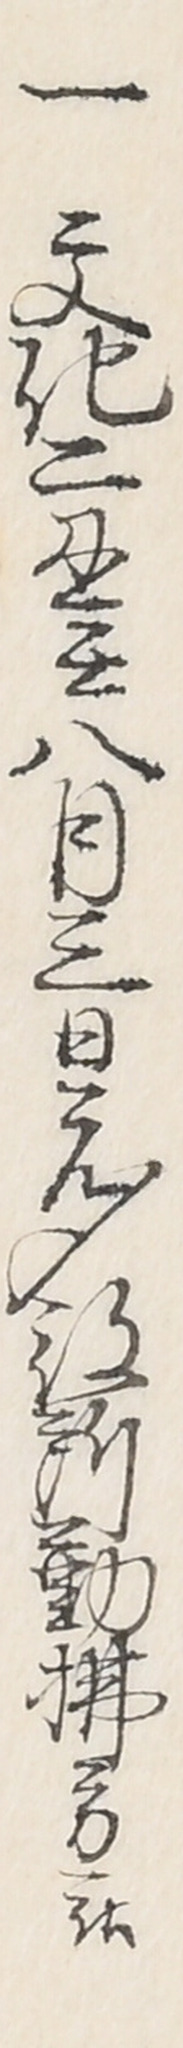一文化二丑閏八月三日元〆役所勤払方被
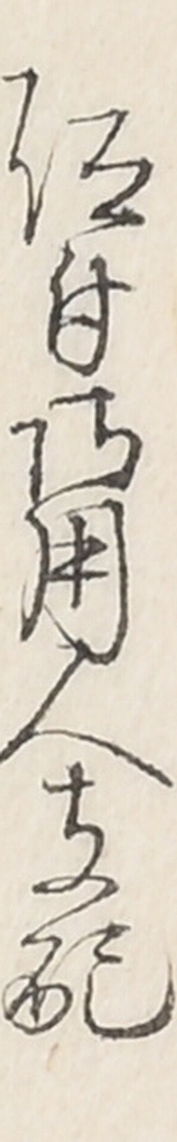仰付御用人支配
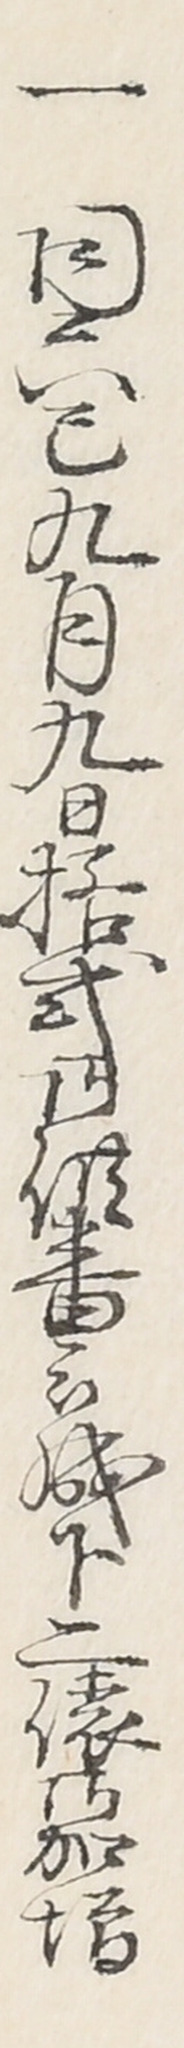一同六巳九月九日格式御供番被成下二俵御加増
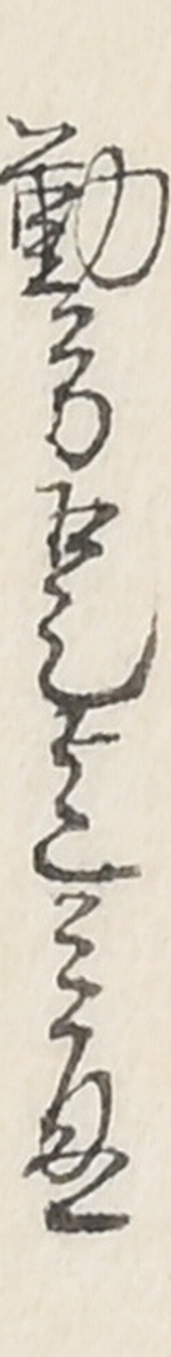勤方是迄之通
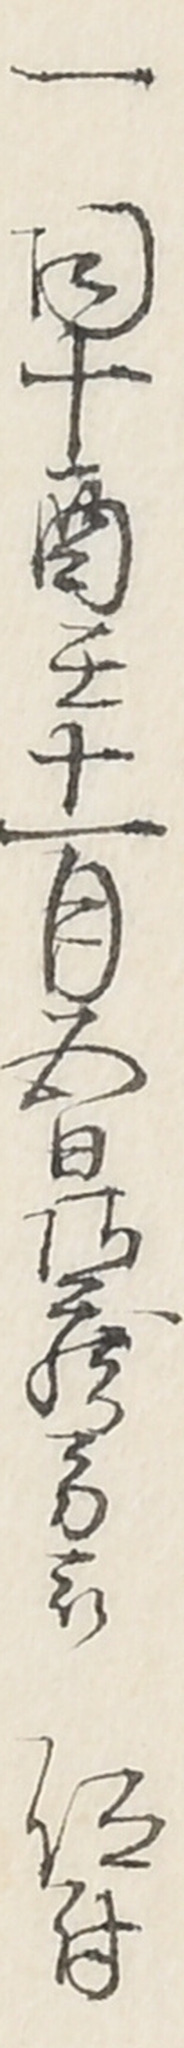一同十酉閏十一月五日御蔵方被仰付
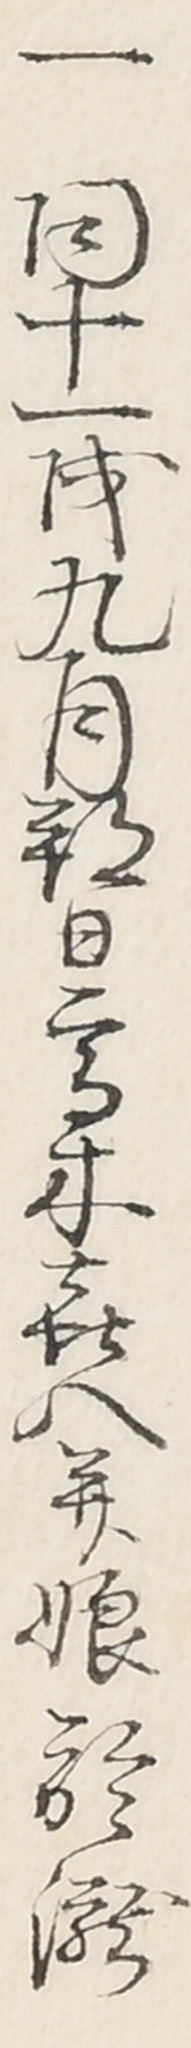一同十一戌九月朔日高木喜八并娘於瀧
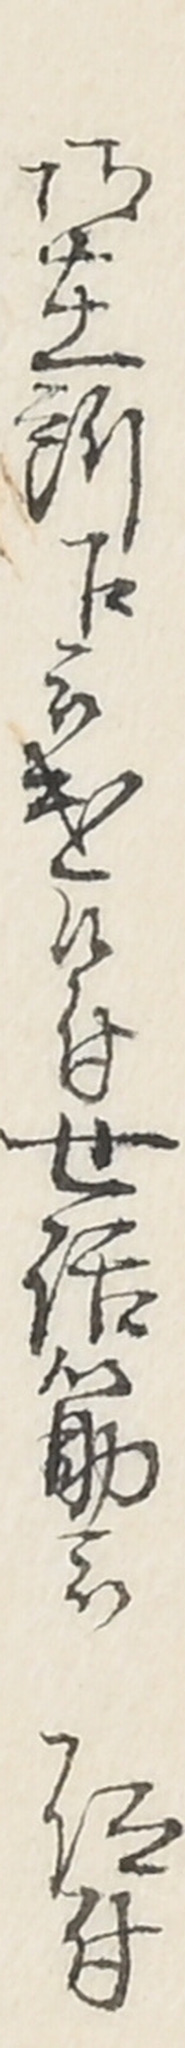御在所江被遣候付世話筋被仰付
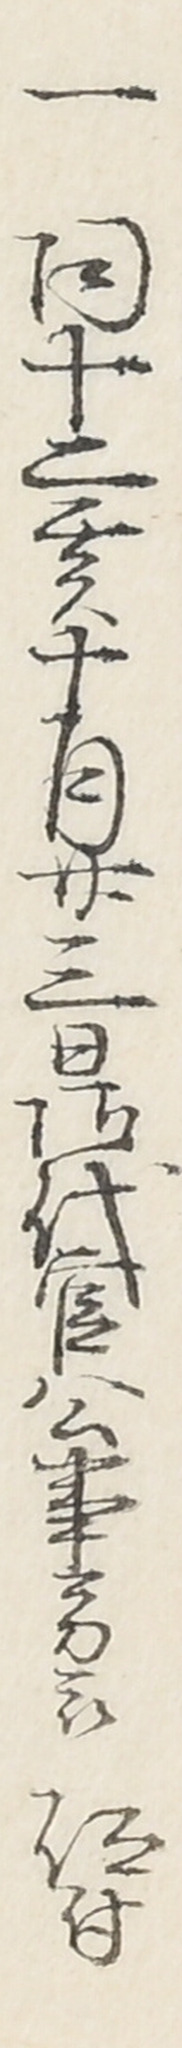一同十二亥十月廿三日御代官公事方被仰付
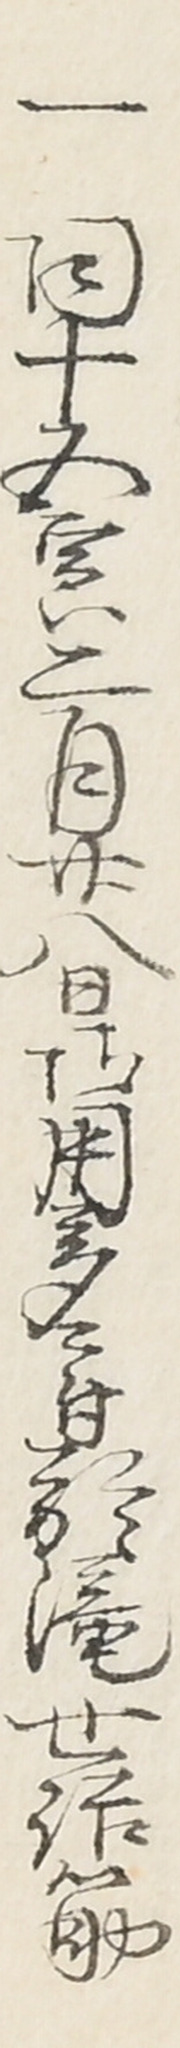一同十五寅二月廿八日御用多ニ付御瀧世話筋
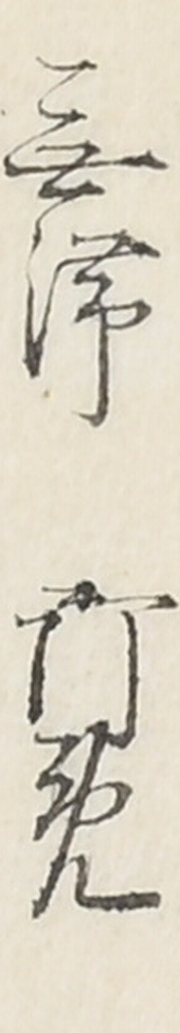無滞御免
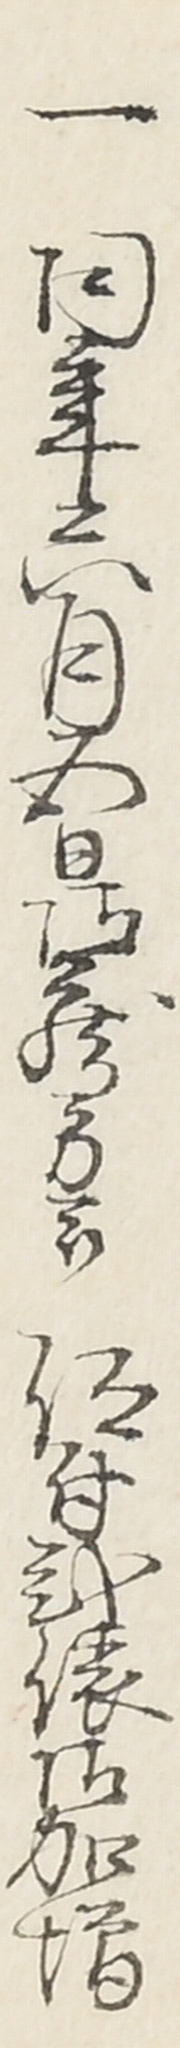一同年六月五日御蔵方被仰付弐俵御加増
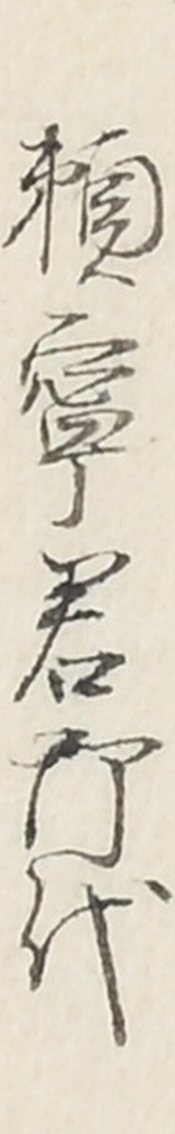頼寧君御代
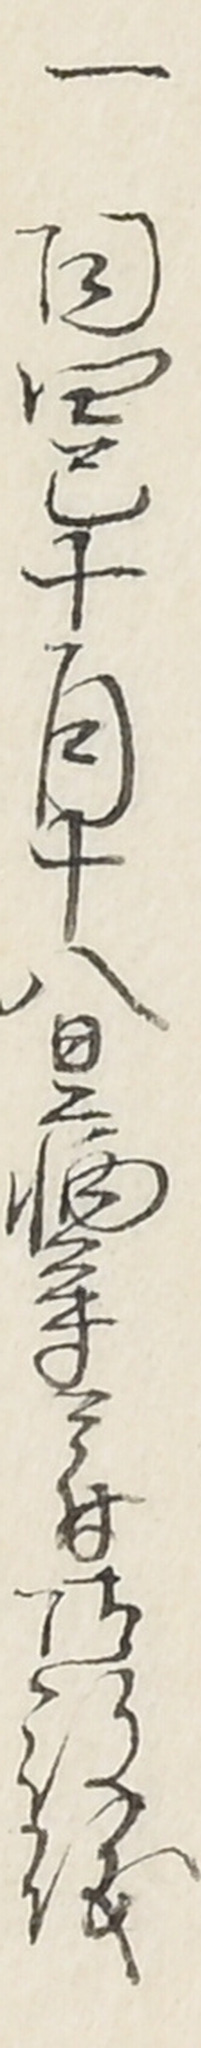一同四巳十月十八日病気ニ付御役儀
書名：無足諸士勤仕録（四）
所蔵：伊那市立高遠町図書館・合同会社AMANE
